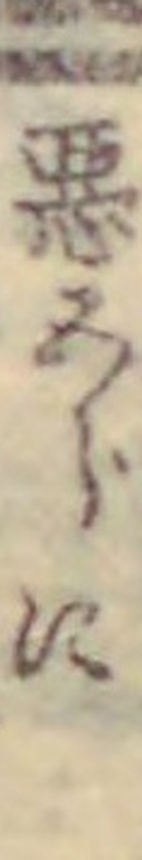悪五郎に
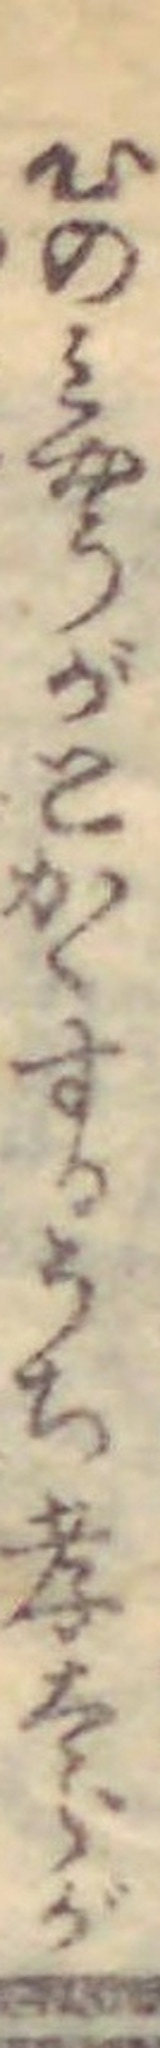心のみやうがとかくするうち孝太郎が
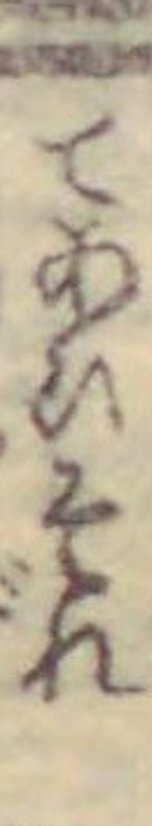であひそれ
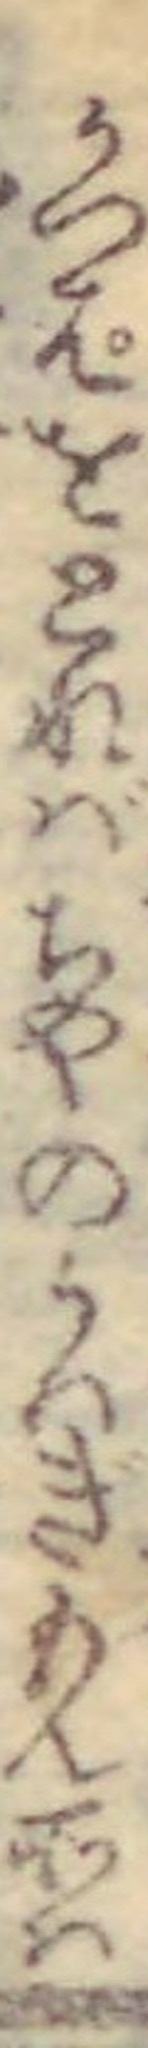かつぱをとればちやのうはぎもん所は
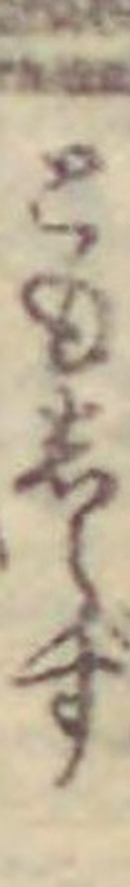ともしらず
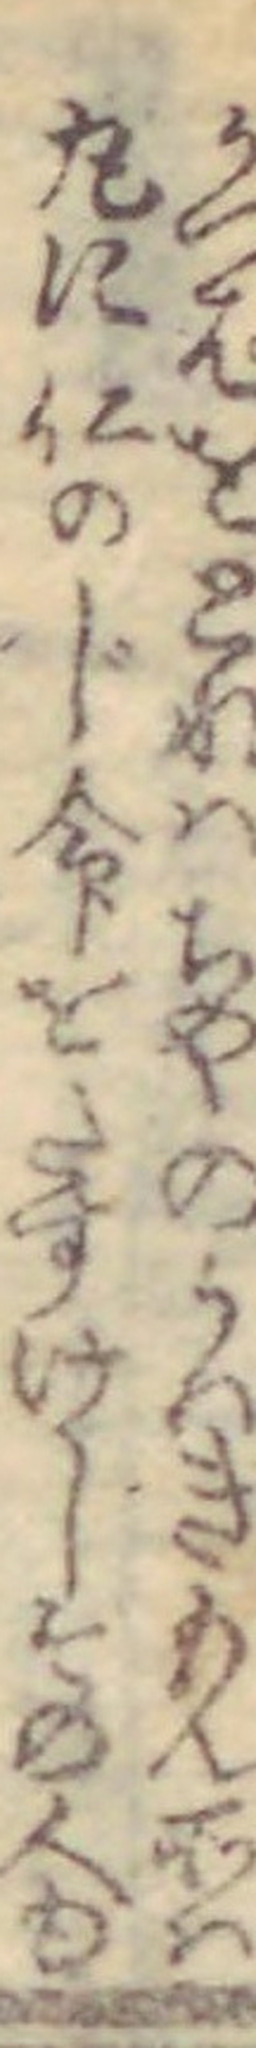丸に仁のじ命をたすけしその人も
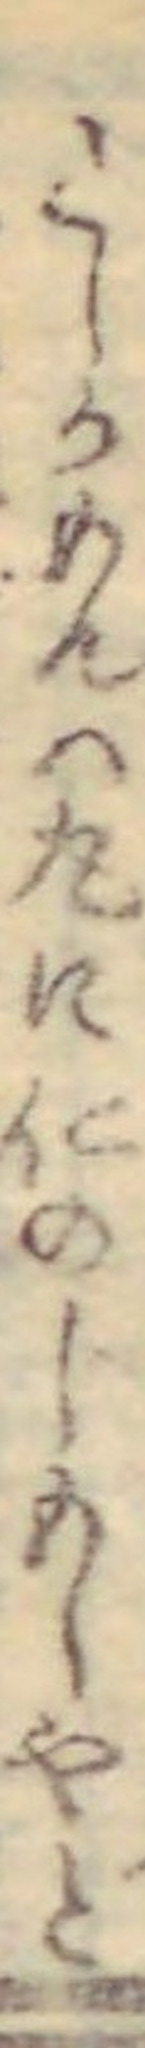たしかもんは丸に仁のじもしやと
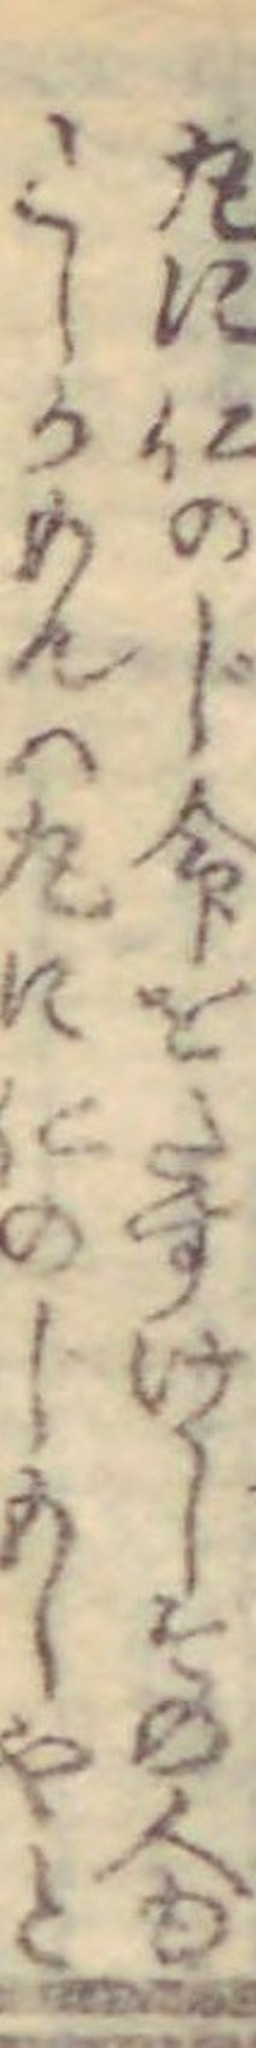たしかもんは丸に仁のじもしやと
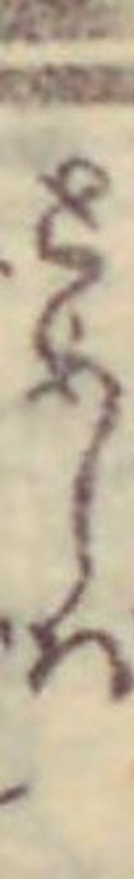とめしは
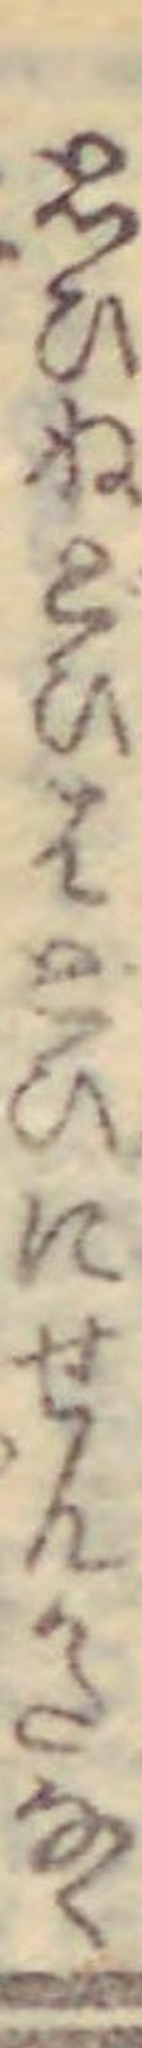思ひねどひはとひにせんかたなく
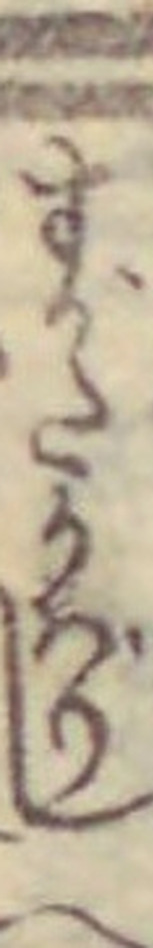すがたかはりし
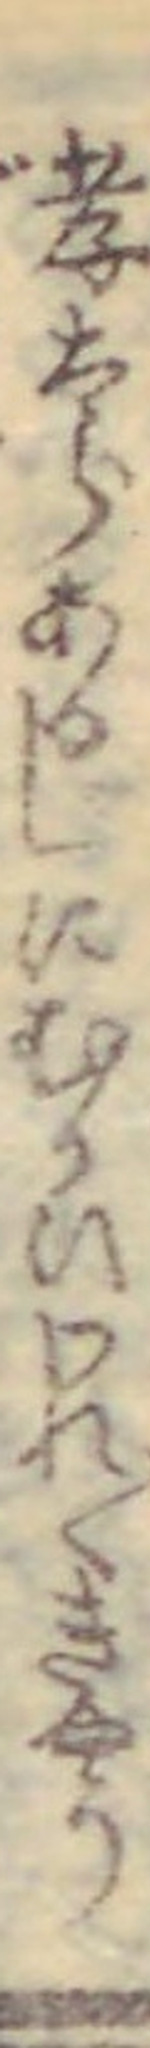孝太郎あるじにむかひわれ〳〵きやう
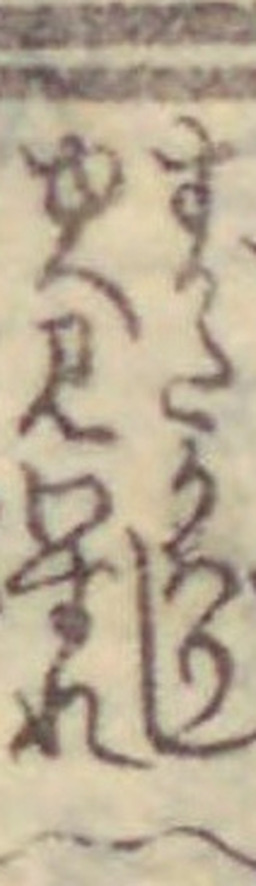ゆへ見わすれ
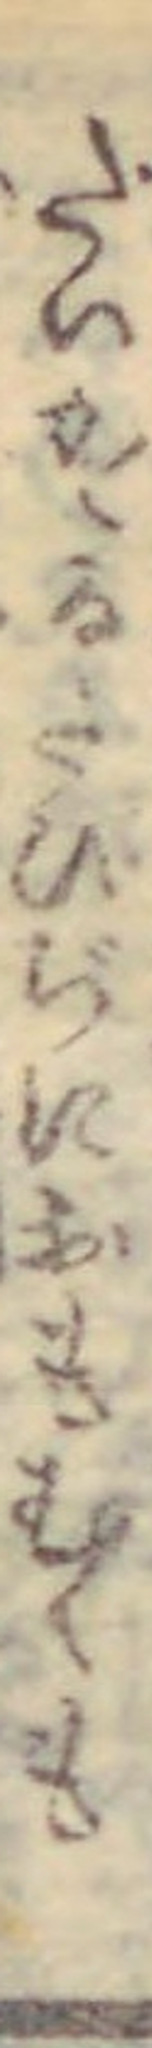だいかゝるたびぢにおもむくも
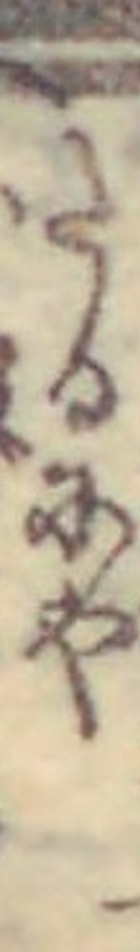たるにや
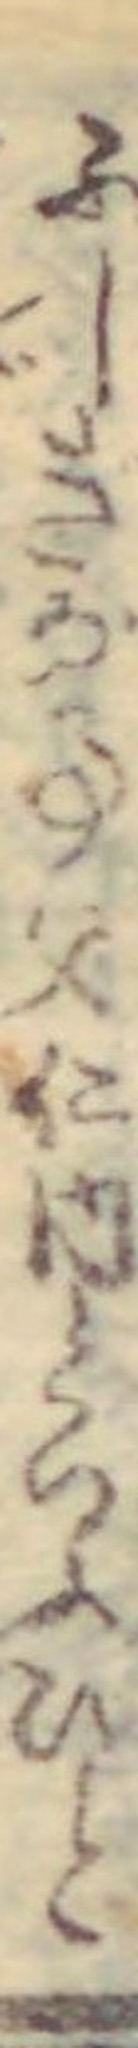ふしぎな事父仁内といふひと
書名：八ツ目鱣因縁物語 3巻
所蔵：国立国会図書館 National Diet Library, JAPAN
